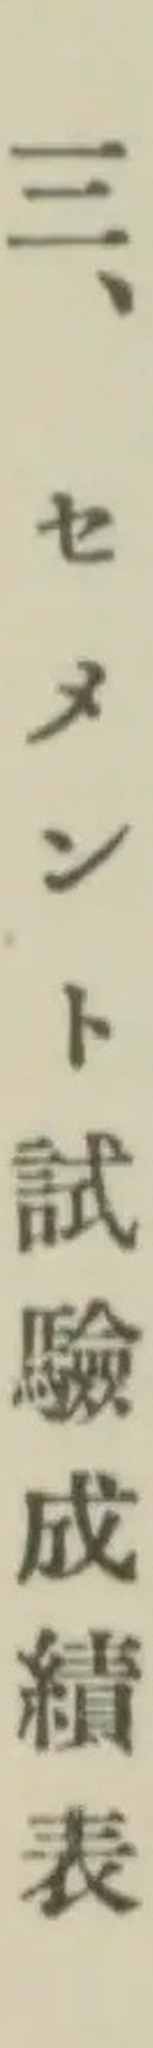三、セメント試験成績表
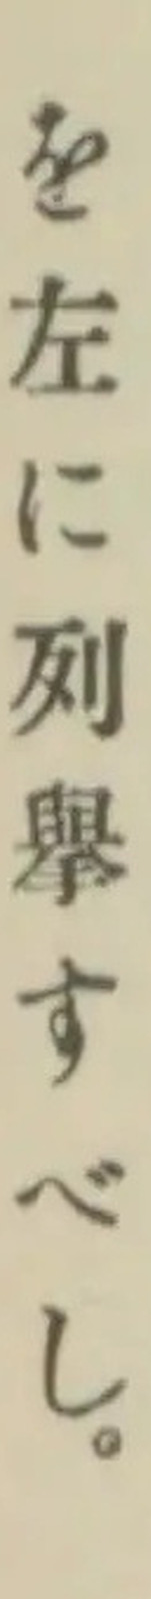を左に列挙すべし。
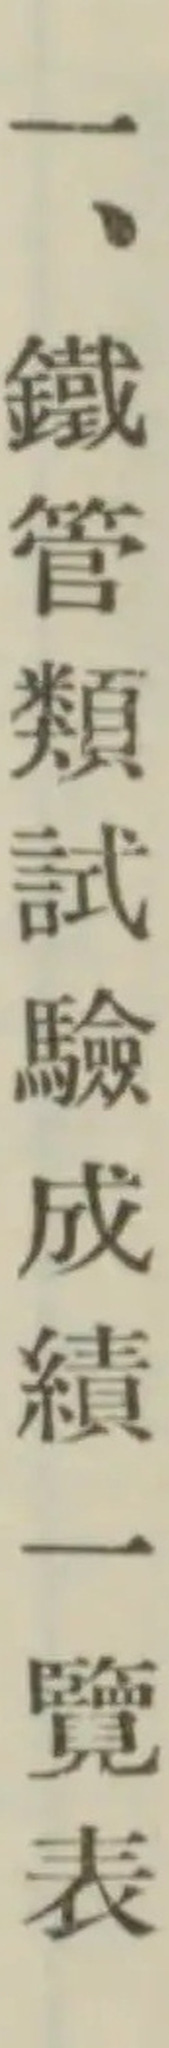一、鐵管類試験成績一覧表

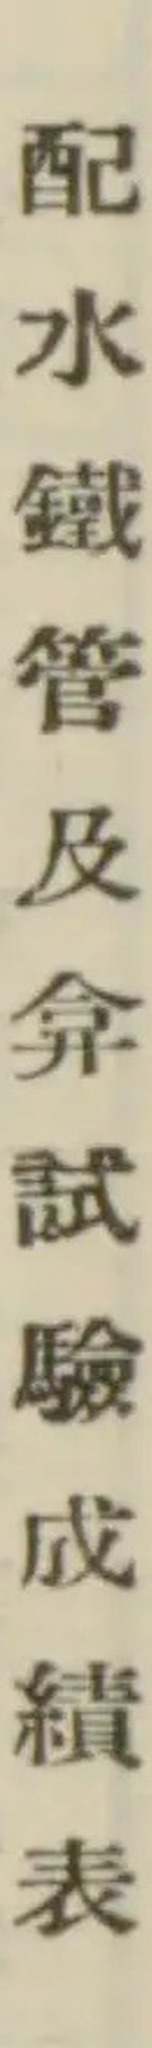配水鐵管及弇試験成績表
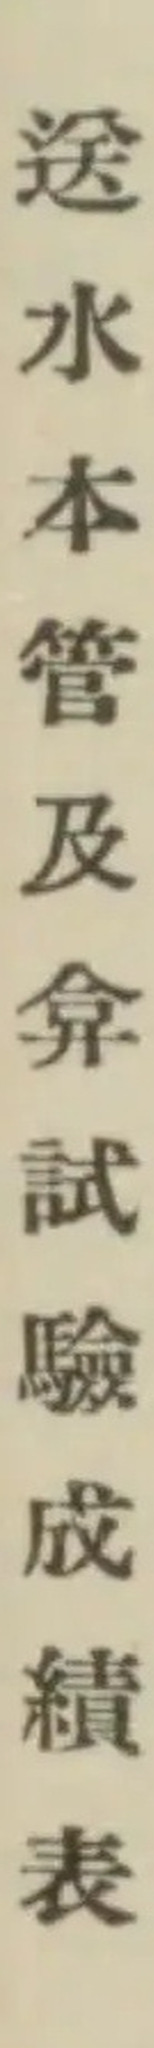送水本管及弇試験成績表
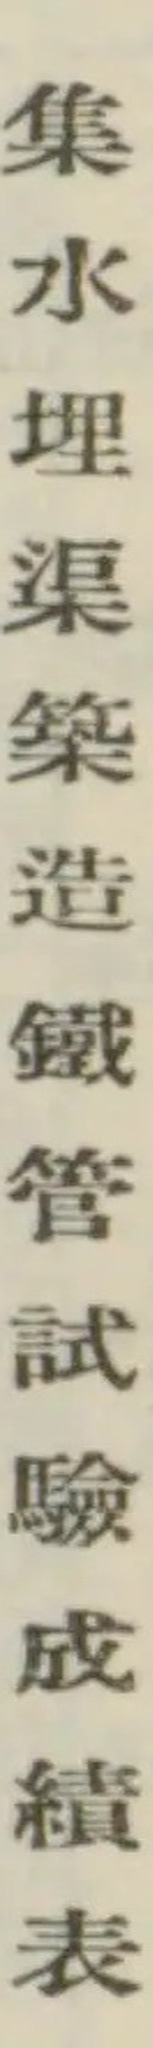集水埋渠築造鐵管試験成績表
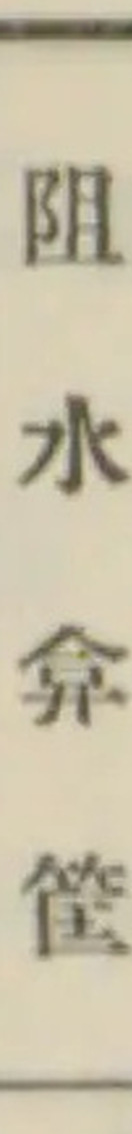阻水弇筐

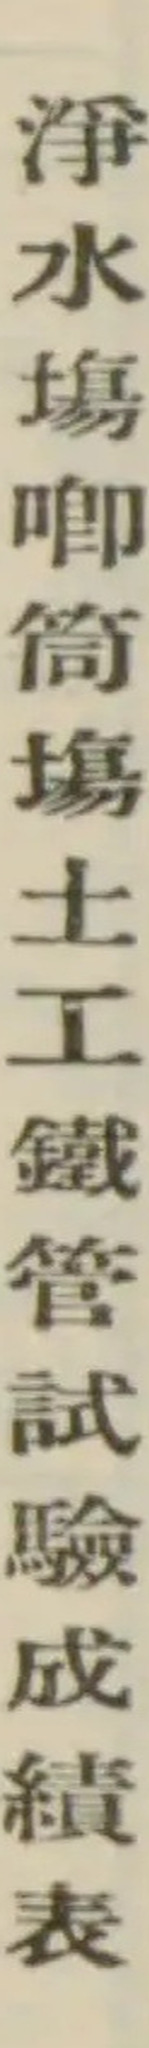浄水場喞筒場土工鐵管試験成績表
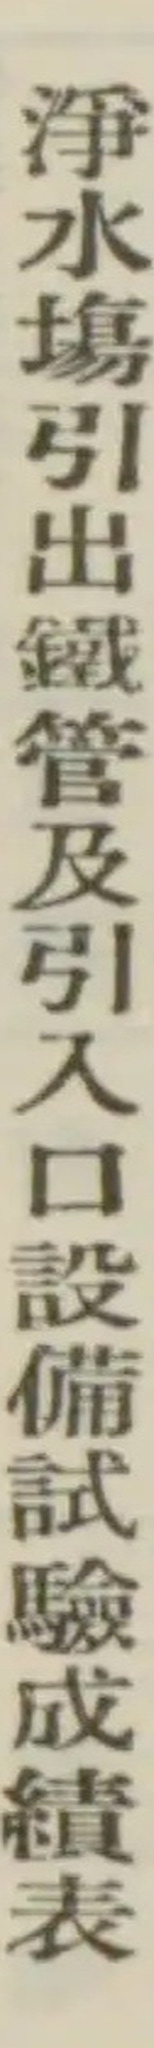浄水場引出鐵管及引入口設備試験成績表
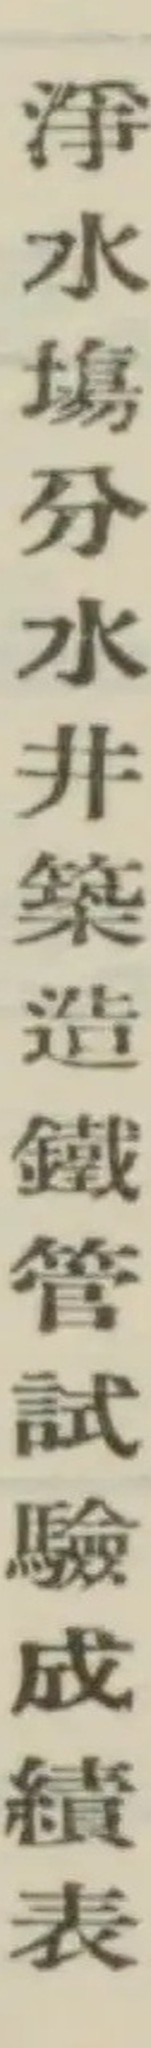浄水場分水井築造鐵管試験成績表
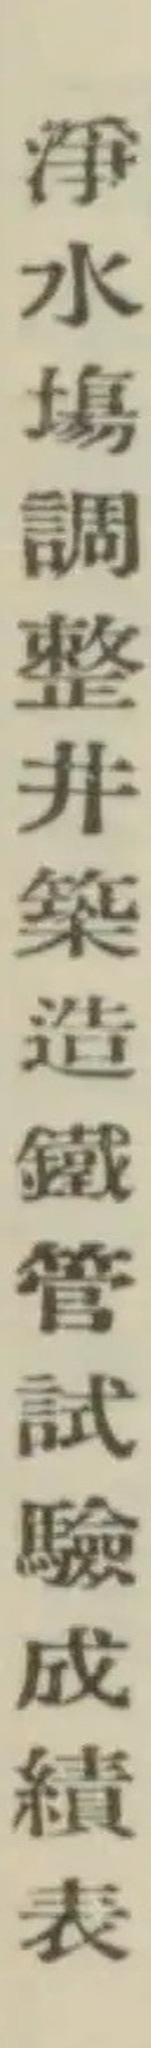浄水場調整井築造鐵管試験成績表

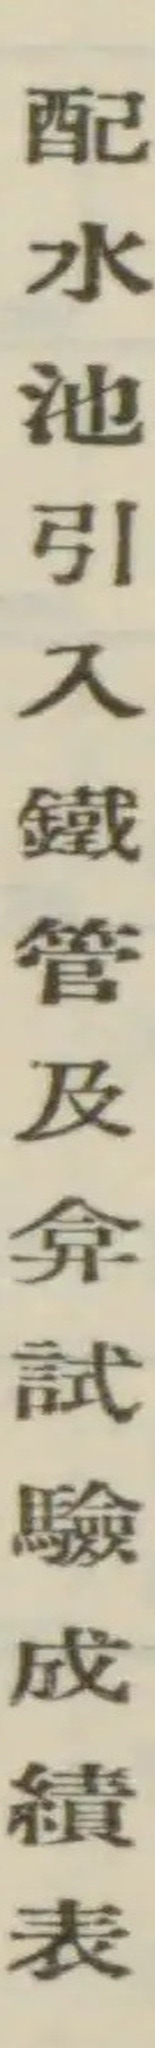配水池引入鐵管及弇試験成績表
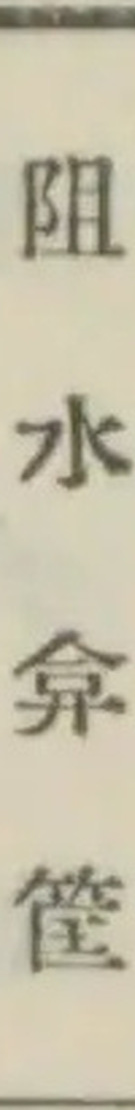阻水弇筐
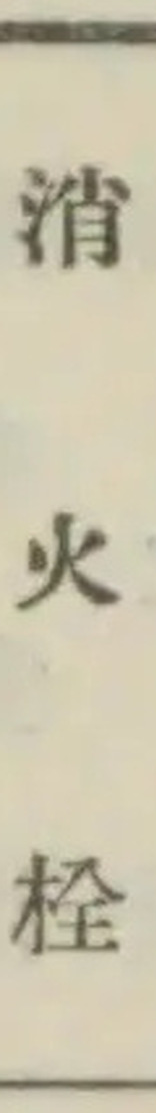消火栓
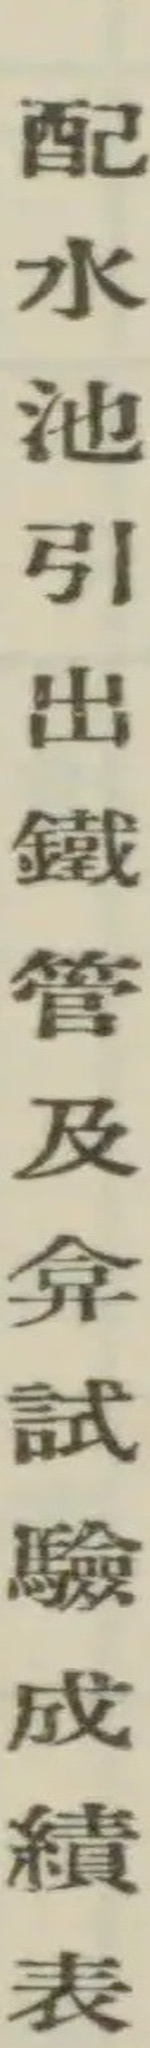配水池引出鐵管及弇試験成績表
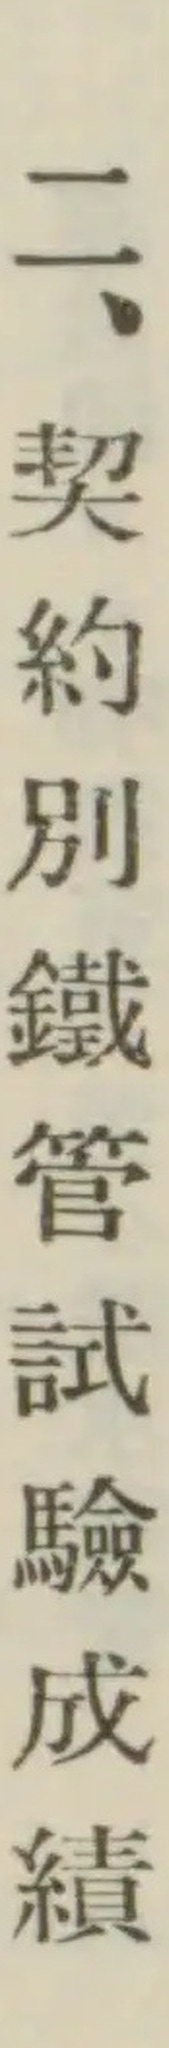二、契約別鐵管試験成績
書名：豊橋市水道誌
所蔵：国立国会図書館 National Diet Library, JAPAN
